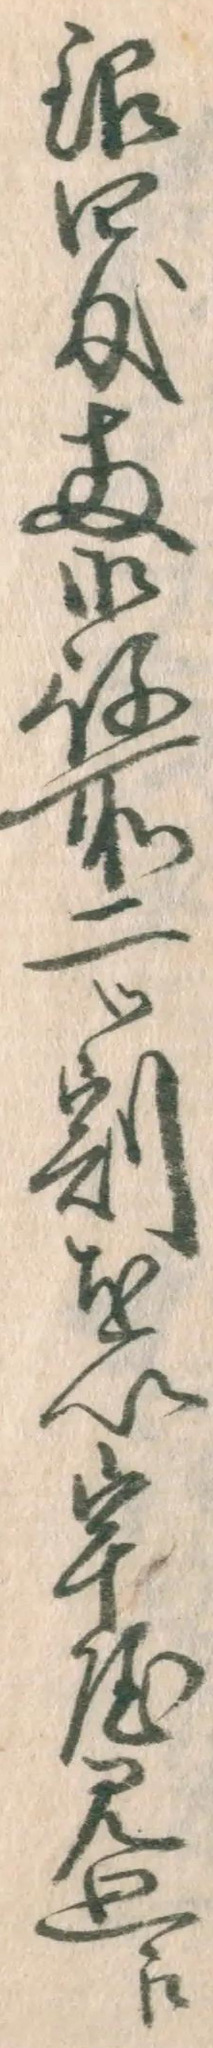銀四匁両御役所二ツ割を以牢屋見廻え
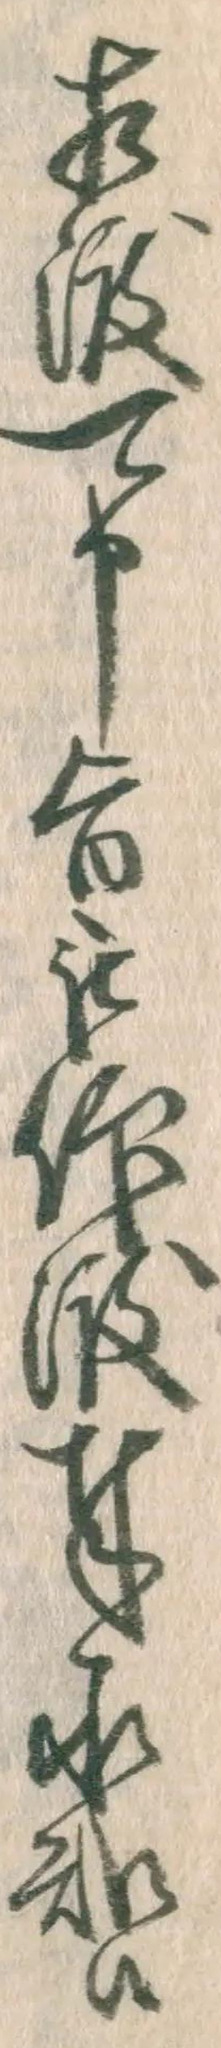相渡可申旨被仰渡奉承知候
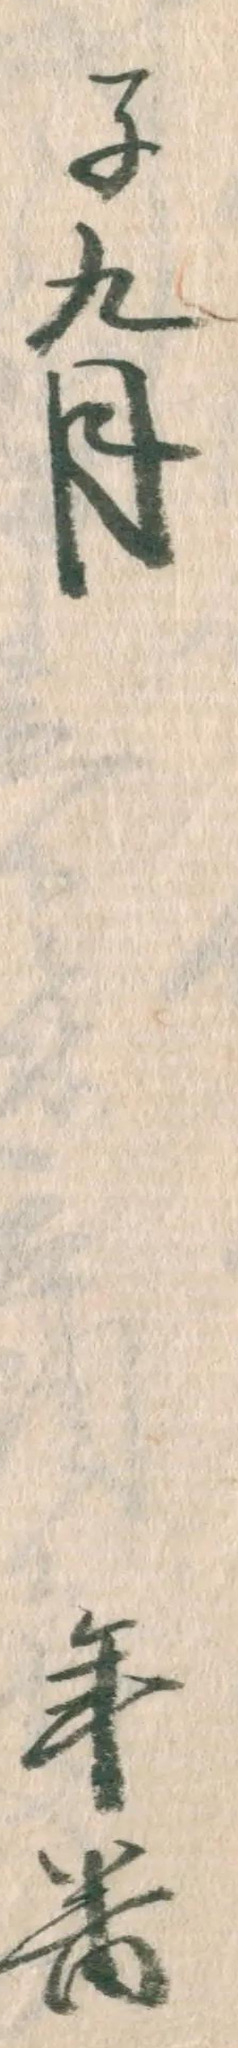子九月年番

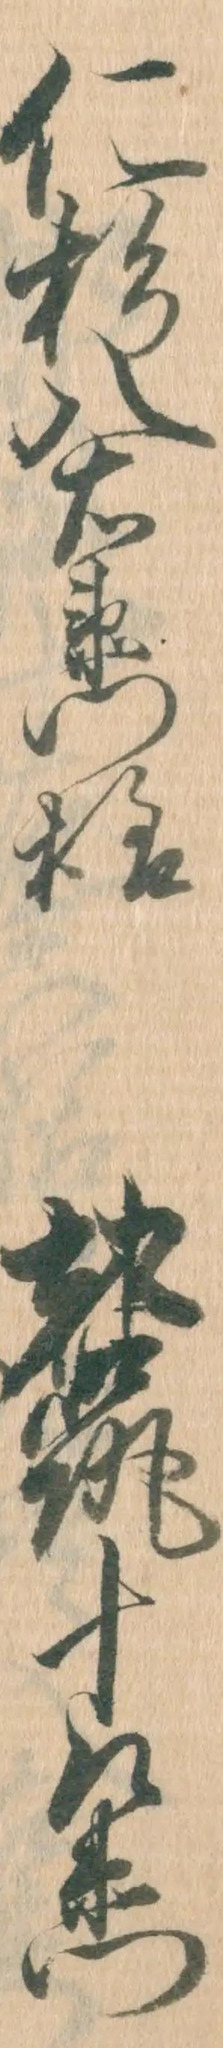仁杉八右衛門様都筑十左衛門
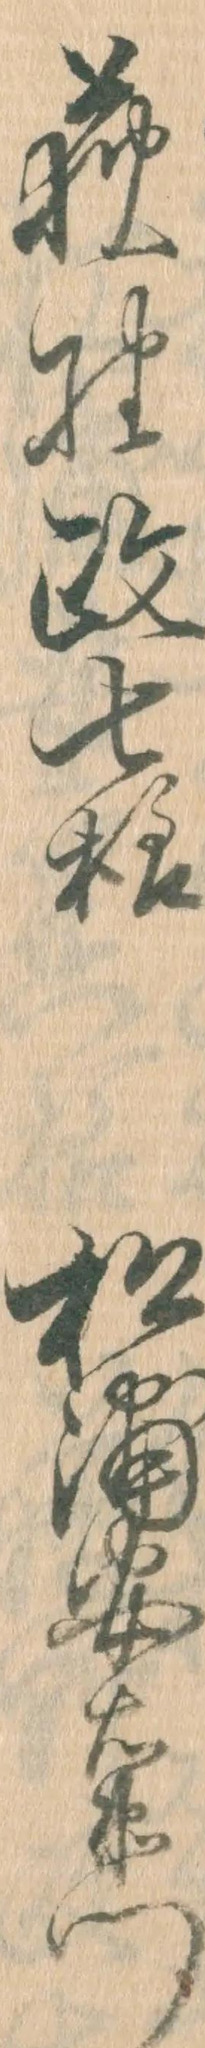荻野政七様松浦安右衛門
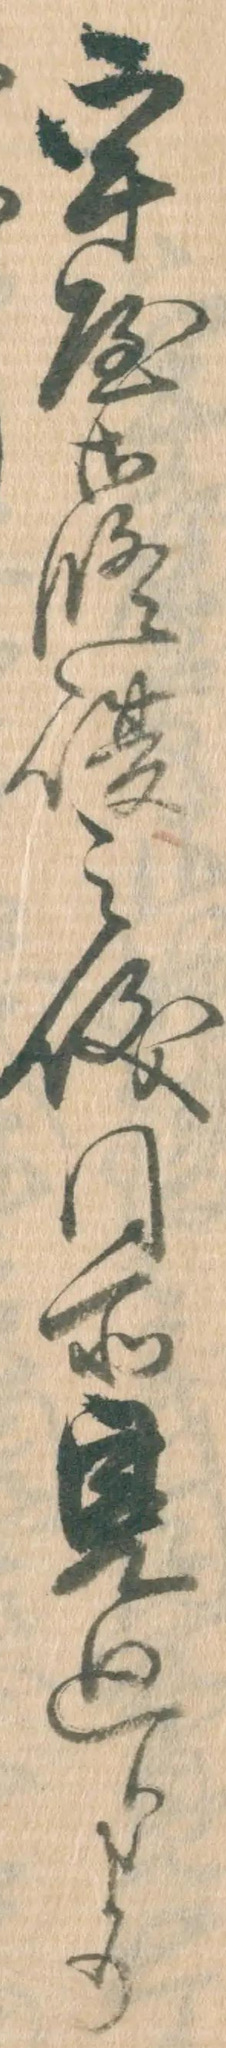牢屋御修復之儀同所見廻りより
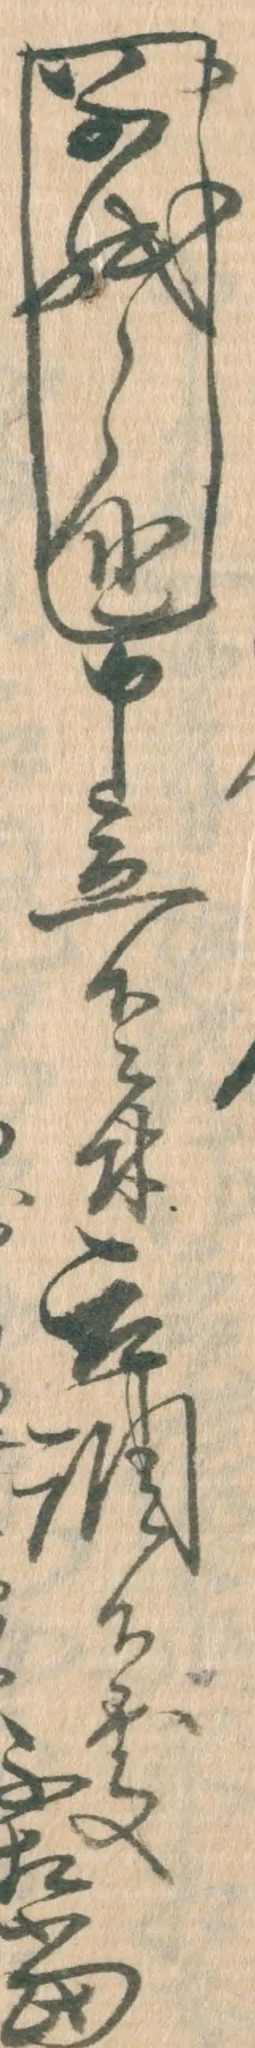別紙之通申立候ニ付取調候処不相当
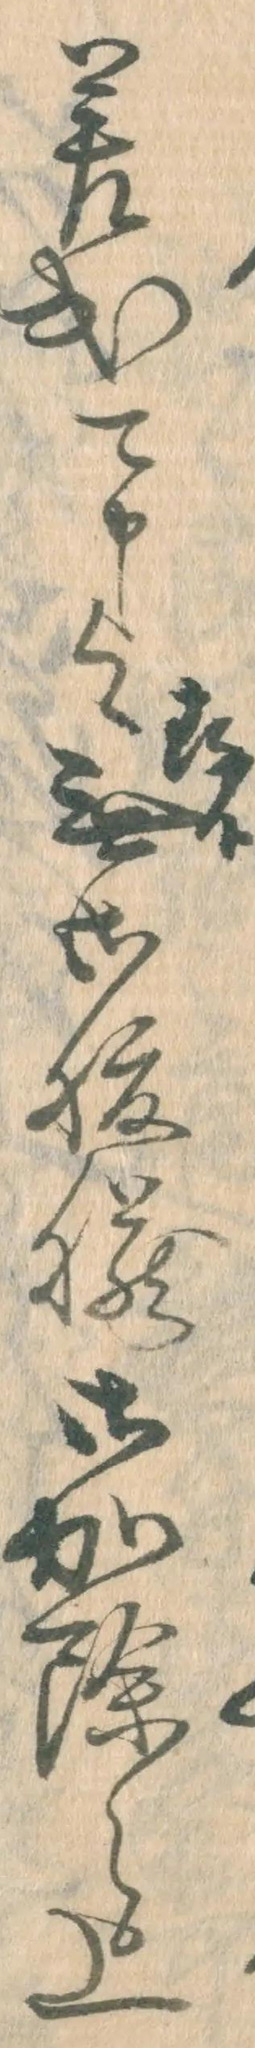差出可申と存候無御腹臓御加除之上

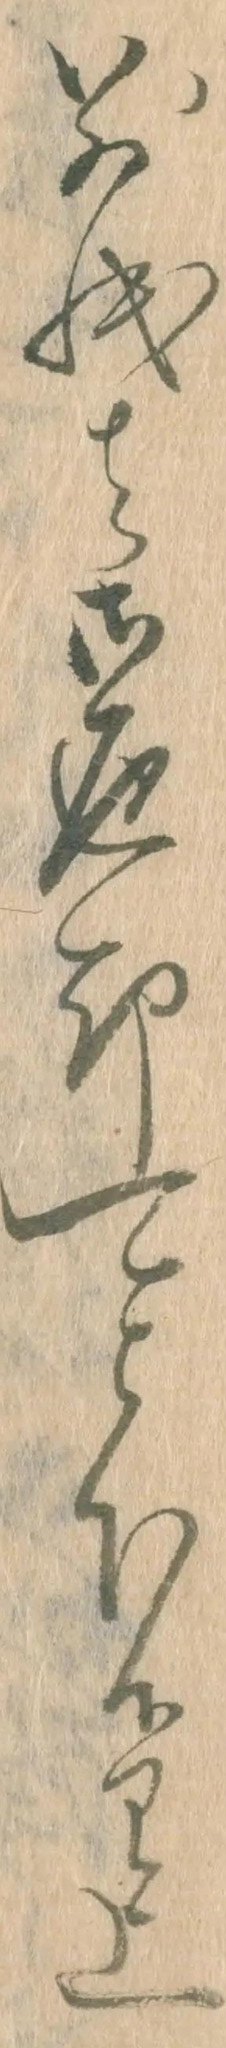別紙は御返却可被下候已上
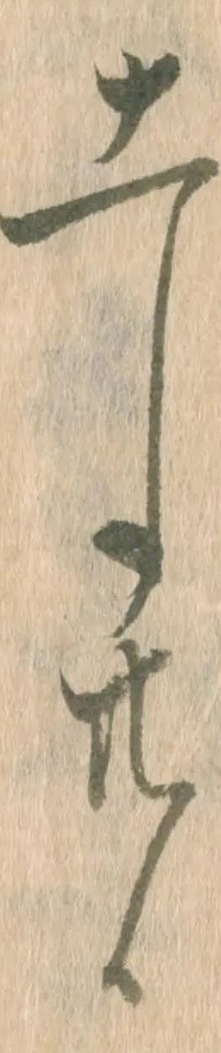十一月廿日
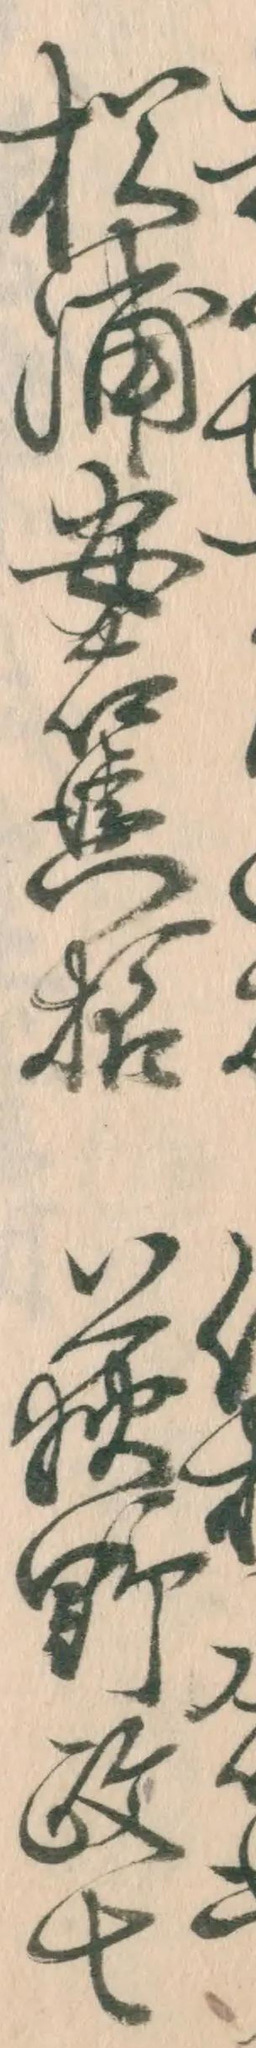松浦安右衛門様荻野政七
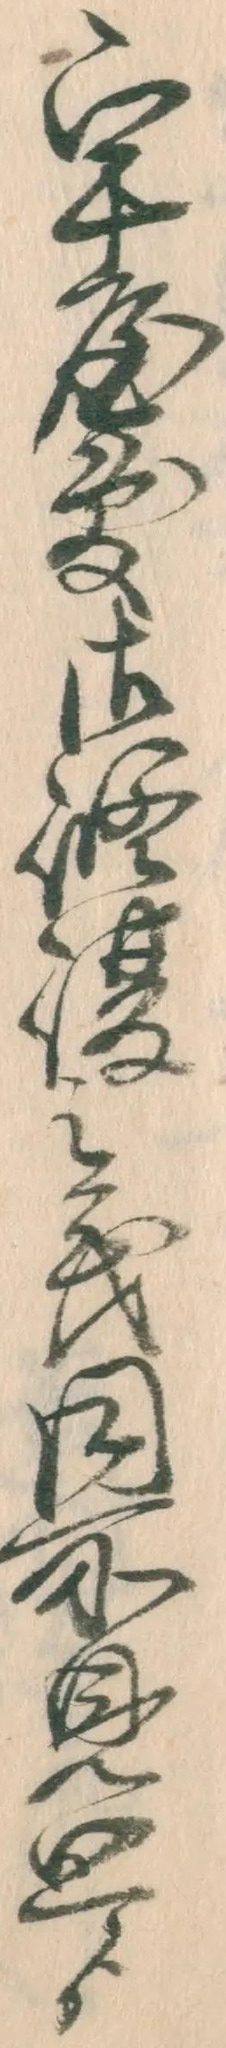牢屋敷御修復之義同所見廻ゟ
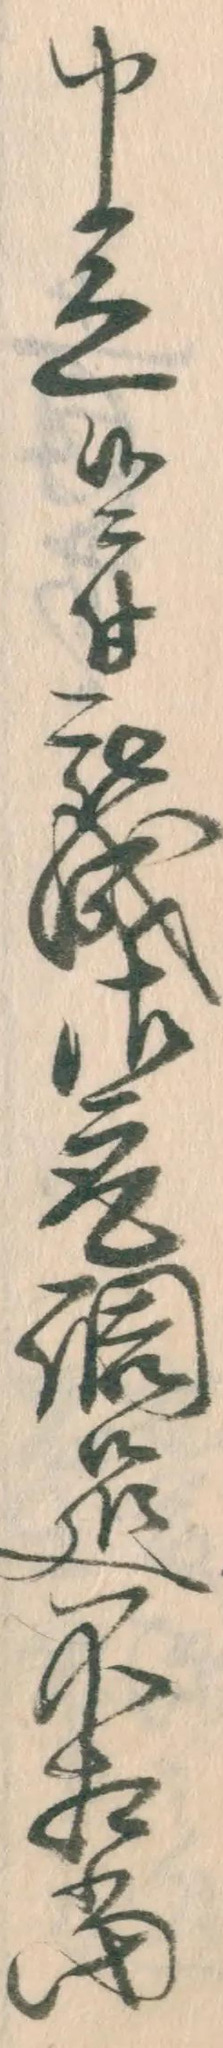申立候ニ付被成御取調候処不相当
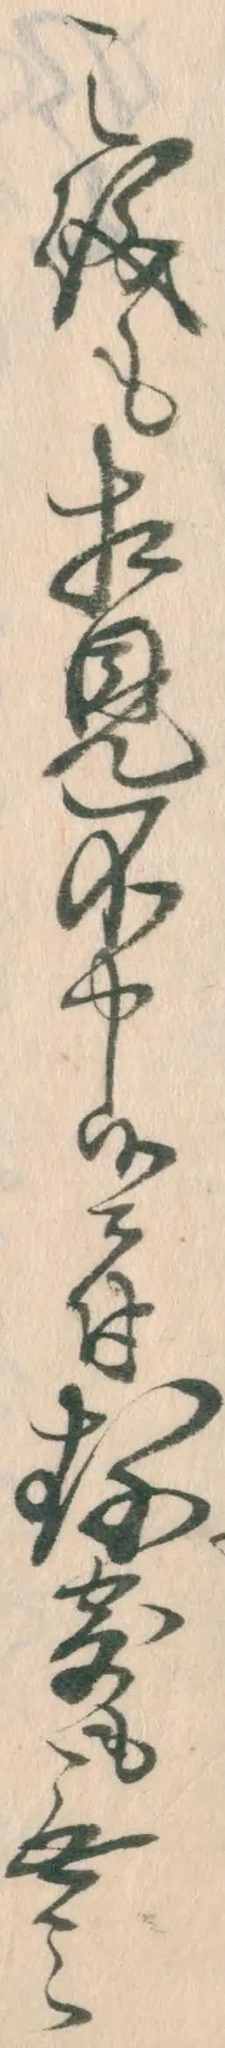之儀も相見不申候ニ付存寄も無之
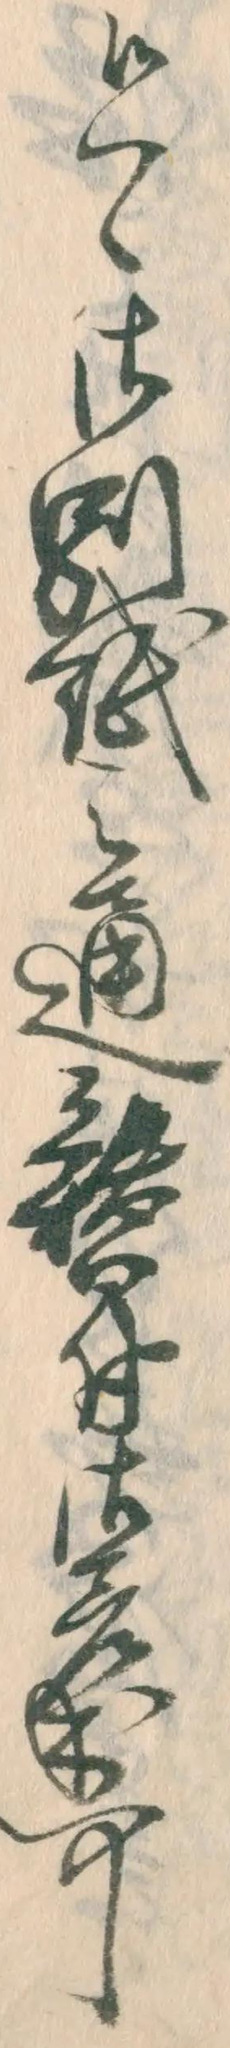候ハヽ御別紙之通鰭付御差出可
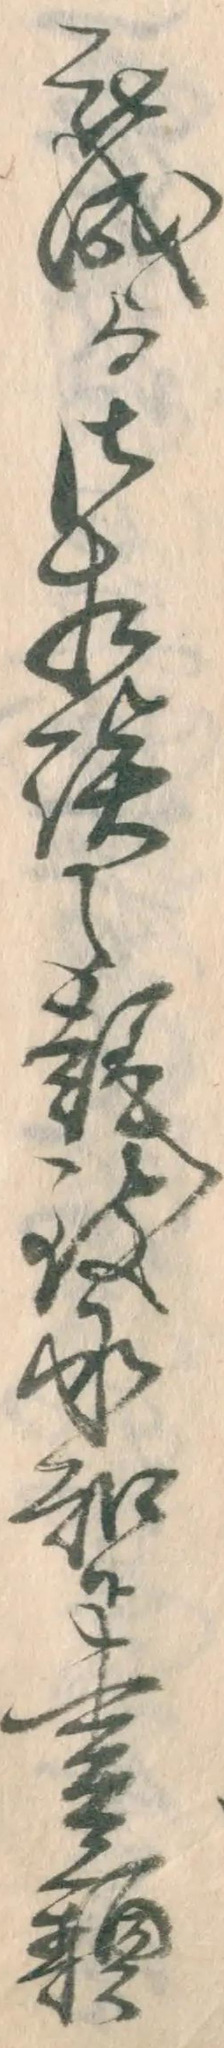被成と御相談之趣致承知候書類
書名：七十冊物類集 71巻. [44] 四十三 牢屋敷御普請御修覆地震ニ付骨折候牢屋掛御褒美之部
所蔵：国立国会図書館 National Diet Library, JAPAN
